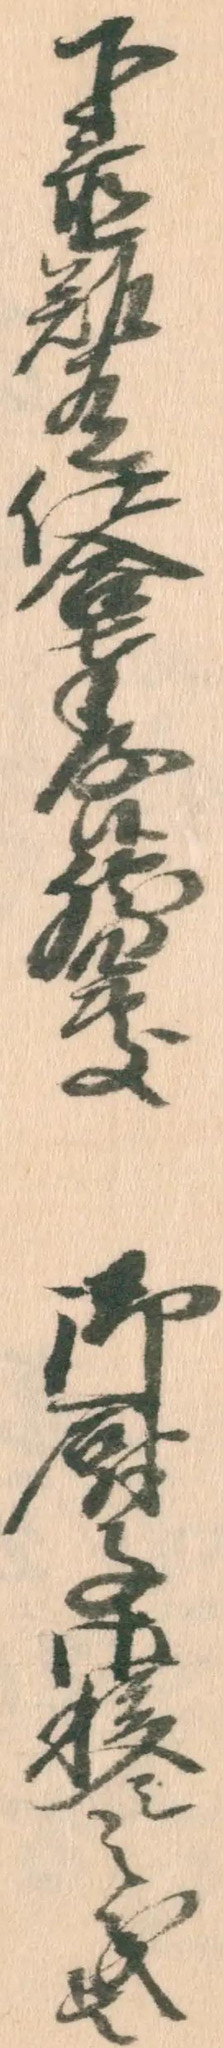下置難有仕合奉存候然処御厨子御損し之義は
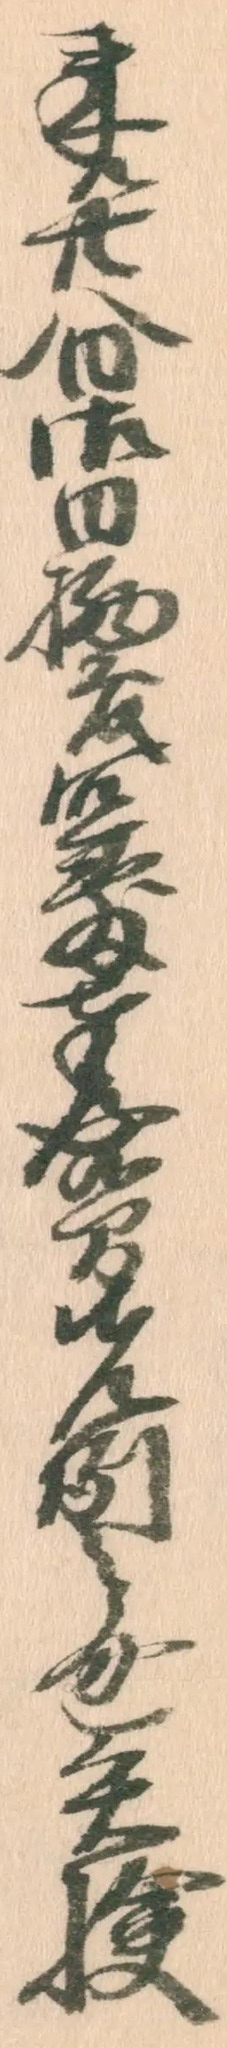来る廿八日御日柄度御敷奉存候間先例之通矢検
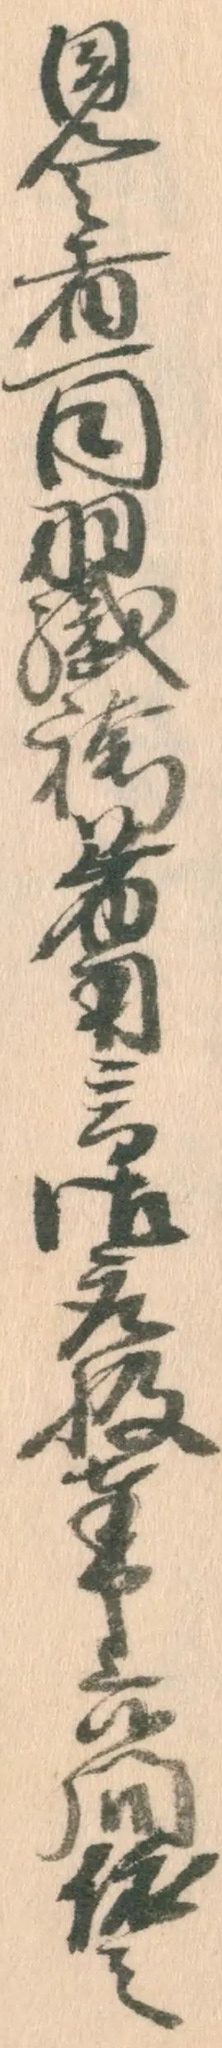見之者一同羽織袴着用に而御取扱奉申上候間依之

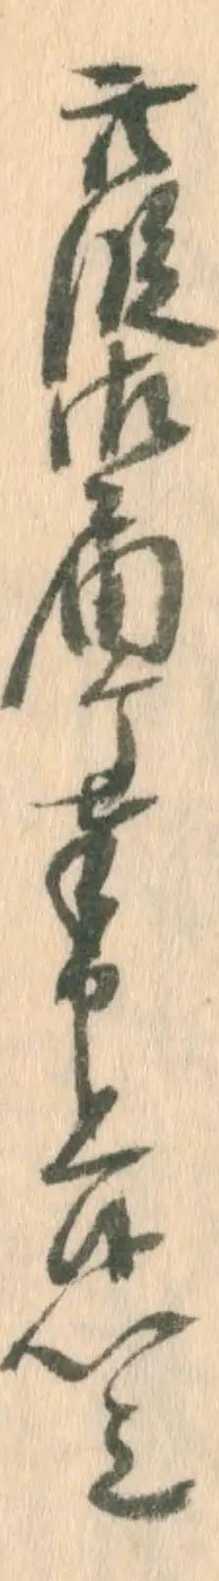此段御届ケ奉申上候以上
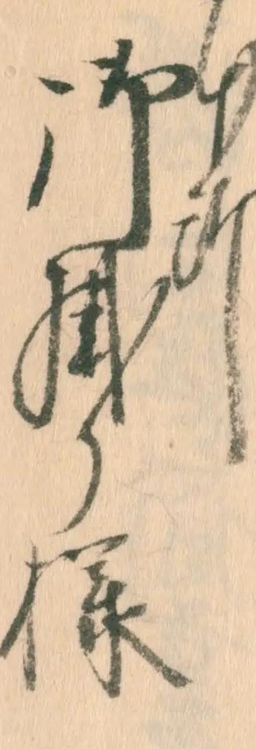御掛り様
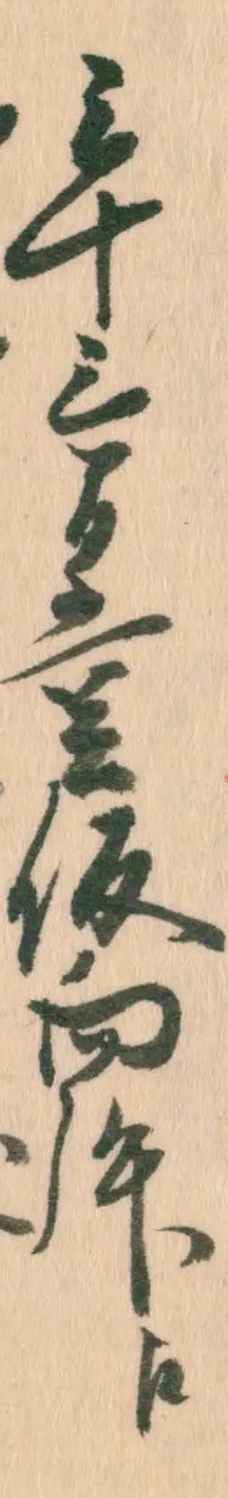三十三間堂仮向拝江
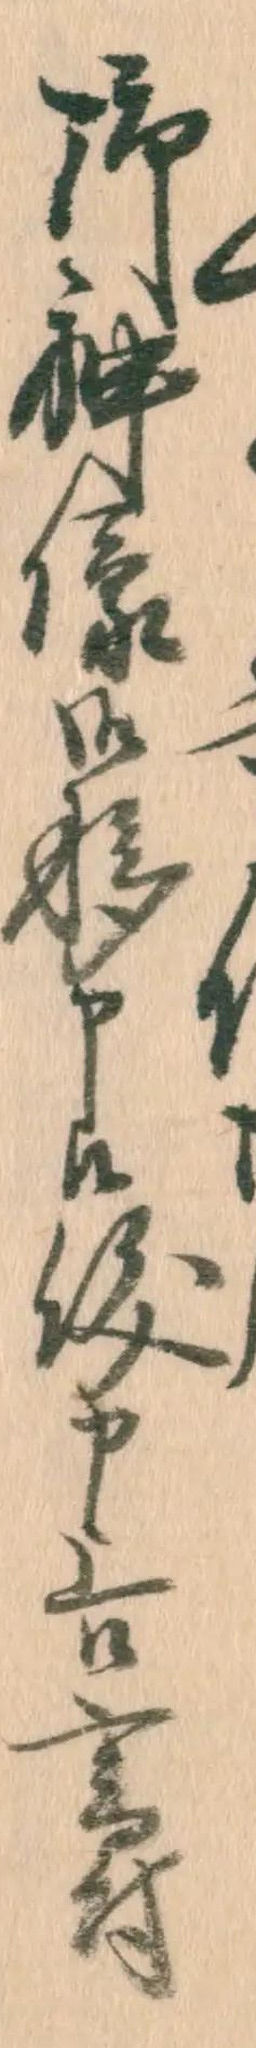御神像御移申候儀申上候書付
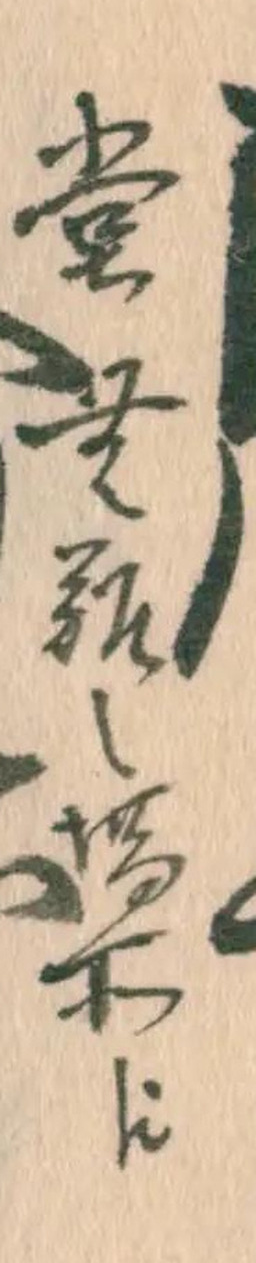堂無難之場所江
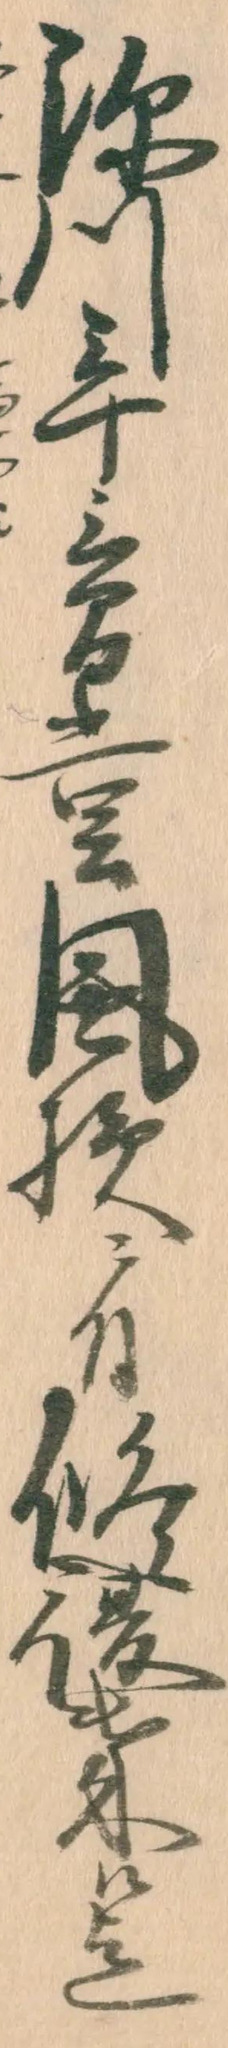深川三十三間堂風損ニ付修復出来候迄

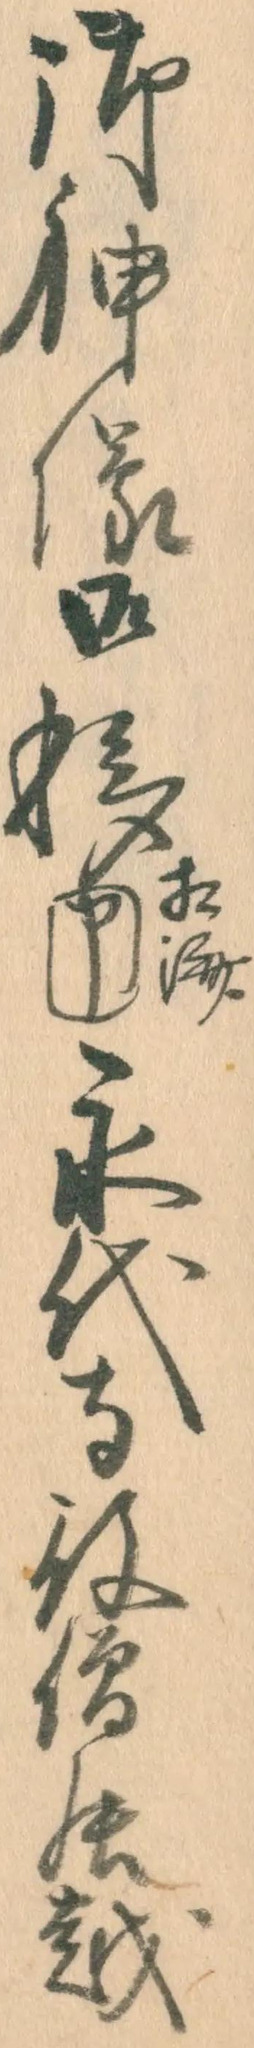御神像御移相済永代寺役僧罷越
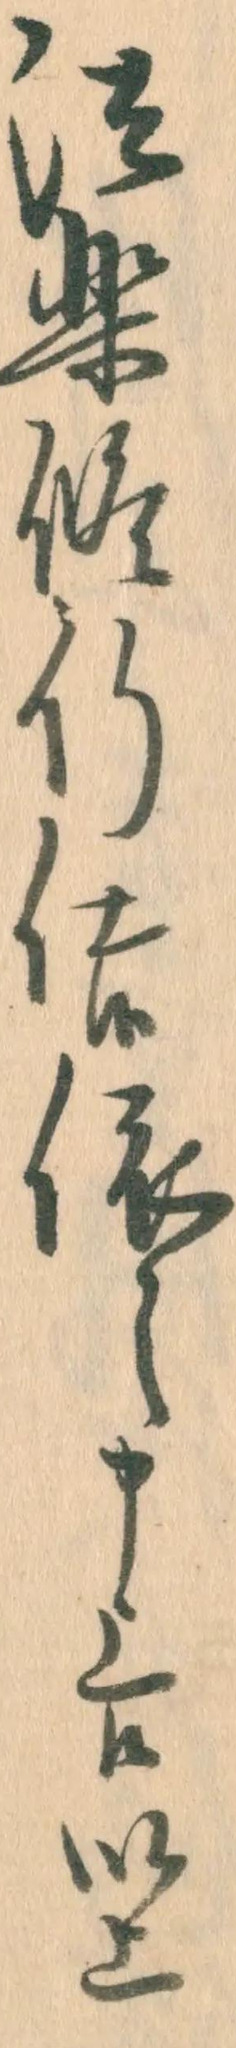法楽修行仕候依之申上候以上
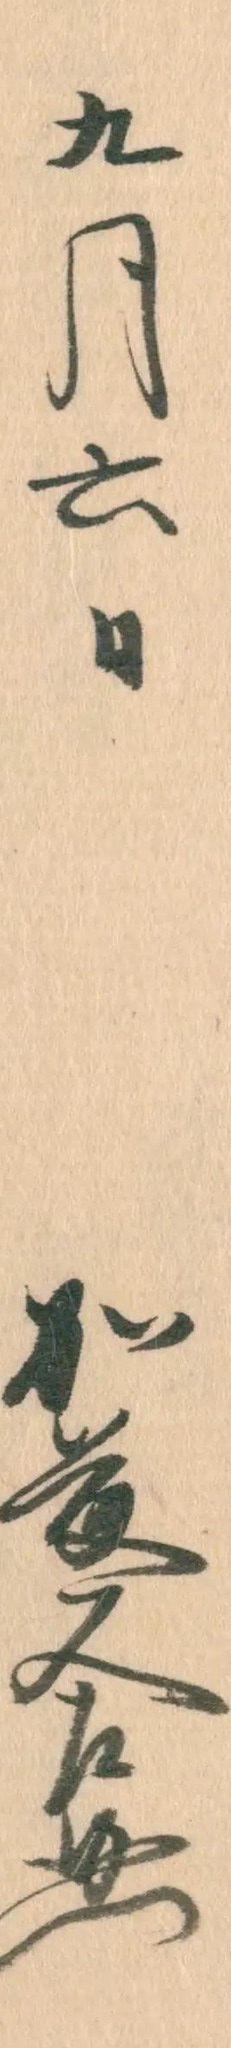九月六日加藤又左衛門
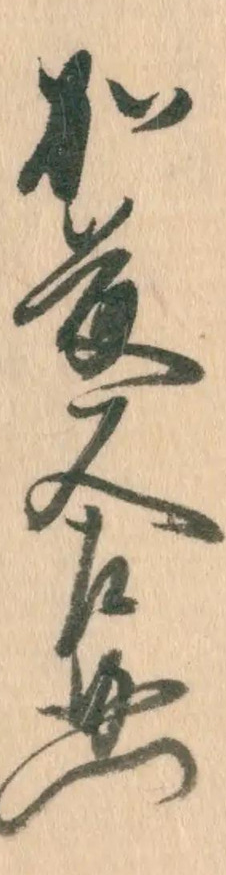九月六日加藤又左衛門
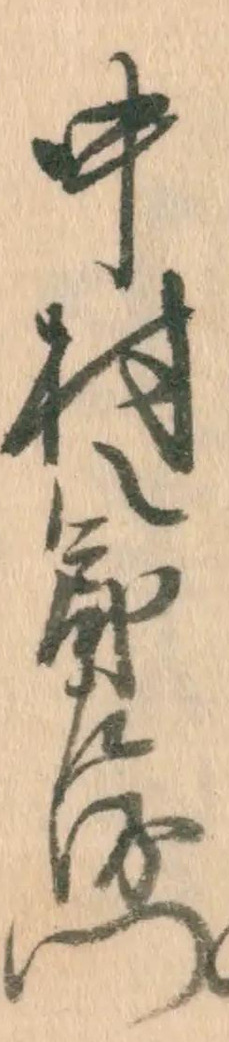中村八郎左衛門
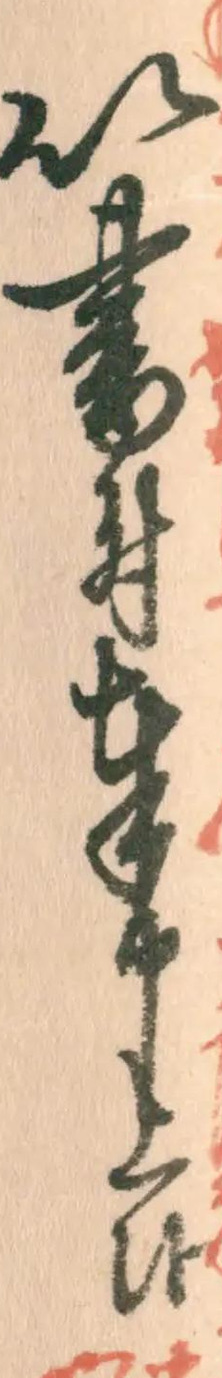以書付奉申上候
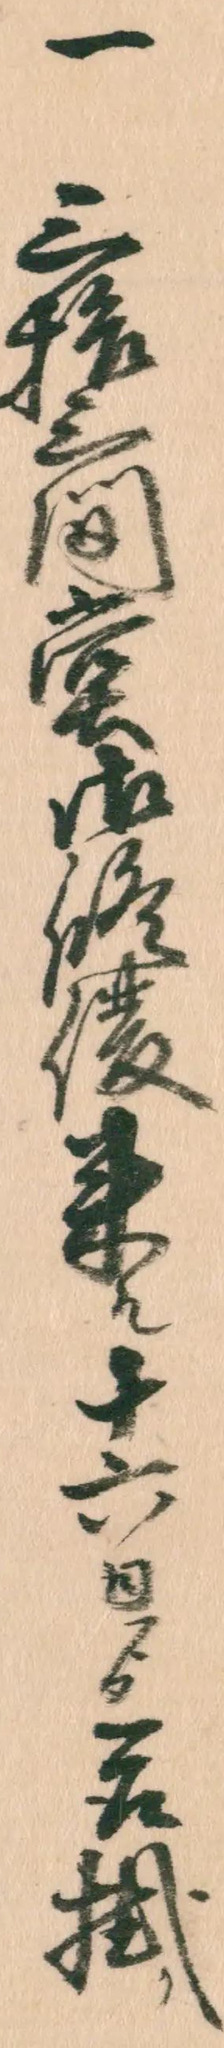一三拾三間堂お修復来ル十六日ゟ取掛り
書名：三十三間堂. [1]
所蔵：国立国会図書館 National Diet Library, JAPAN
